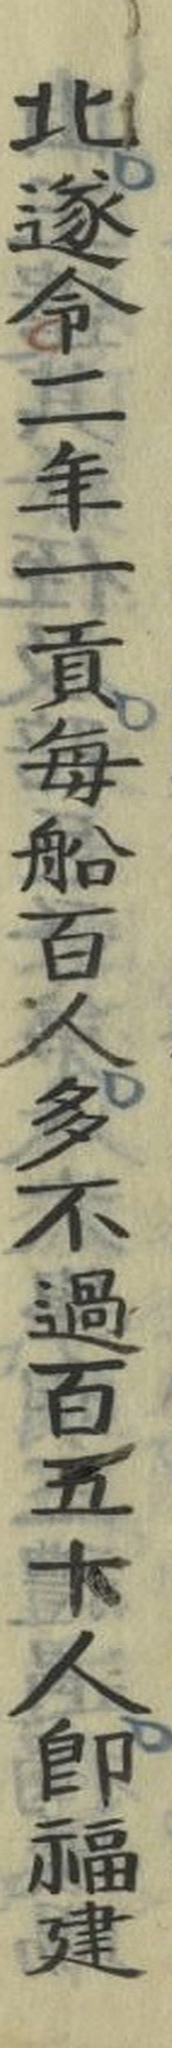北。遂令二年一貢。每船百人。多不過百五十人。卽福建
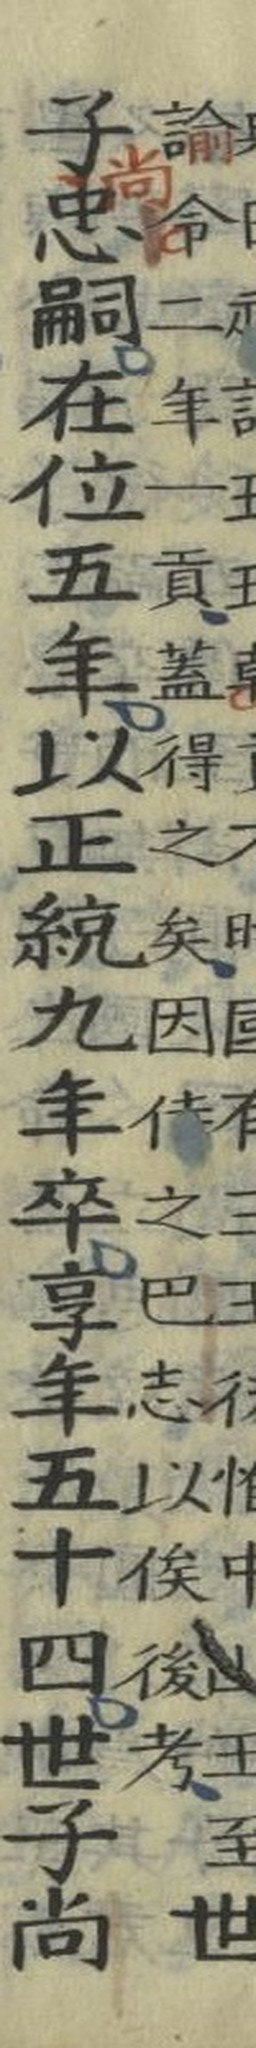子尚忠嗣。在位五年。以正統九年卒。享年五十四。世子尚
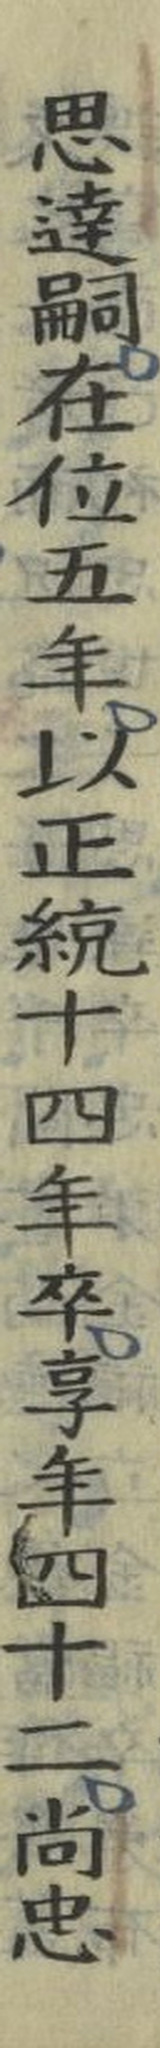思逹嗣。在位五年。以正統十四年卒。享年四十二。尚忠
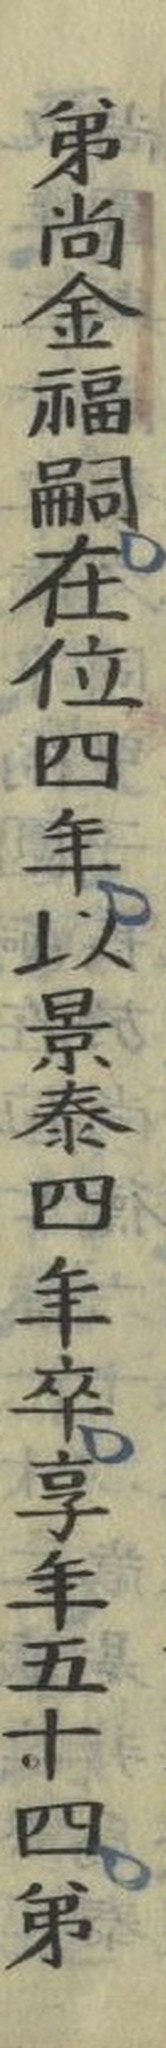弟尚金福嗣。在位四年。以景泰四年卒。享年五十四。弟
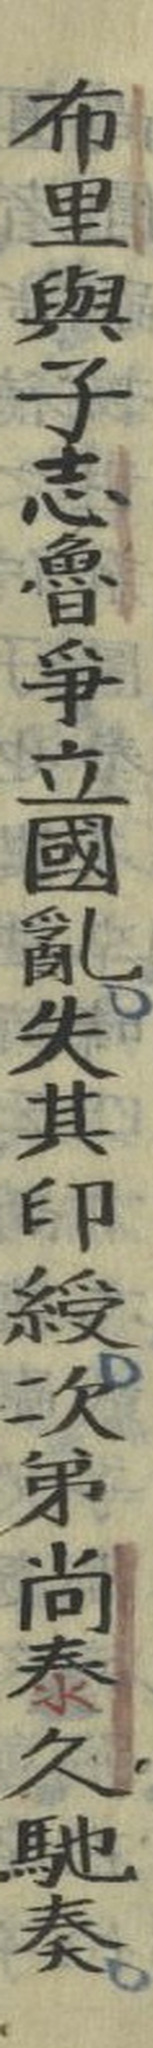布里與子志魯爭立國亂。失其印綬。次弟尚泰久馳奏。
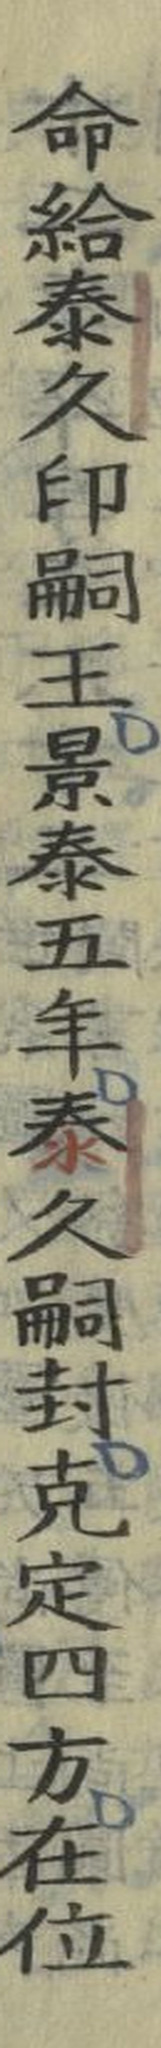命給泰久印嗣王。景泰五年。泰久嗣封。克定四方。在位
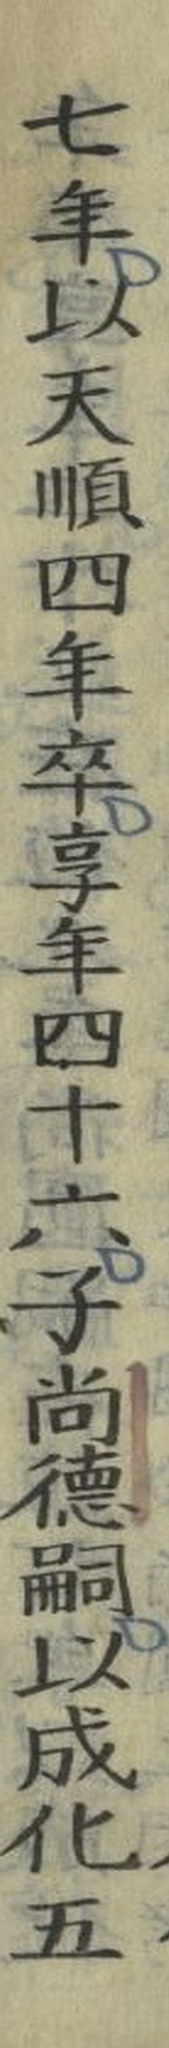七年。以天順四年卒。享年四十六。子尚德嗣。以成化五

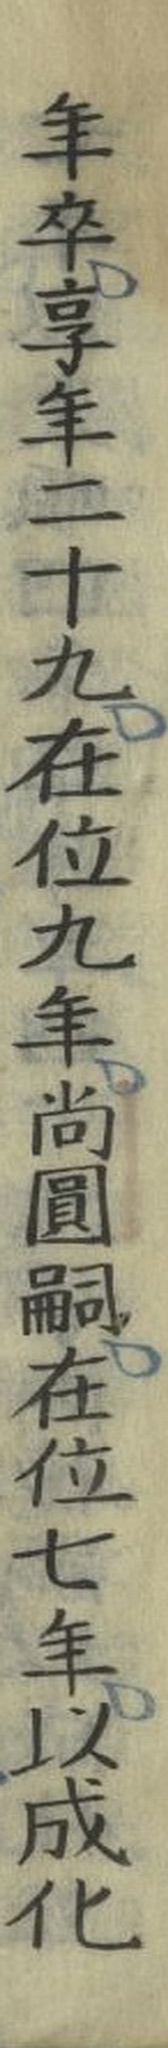年卒。享年二十九。在位九年。尚圓嗣。在位七年。以成化
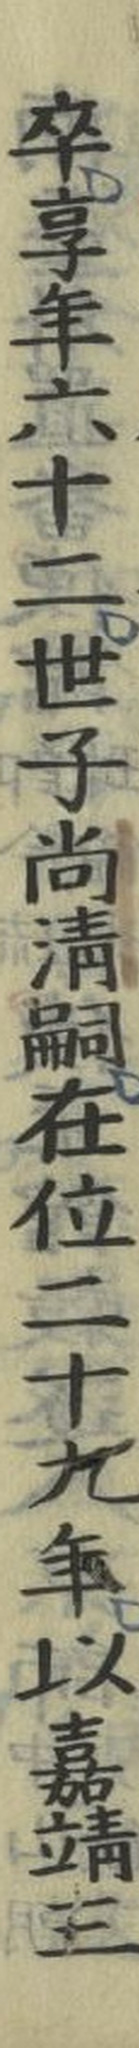卒。享年六十二。世子尚淸嗣。在位二十九年。以嘉靖三
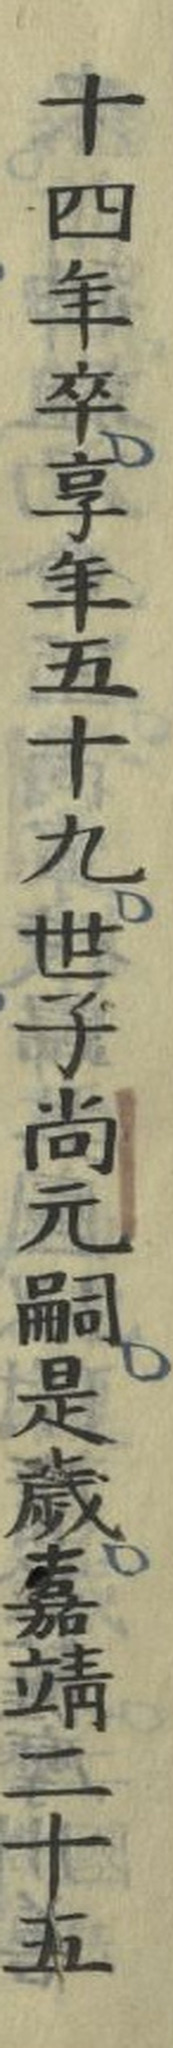十四年卒。享年五十九。世子尚元嗣。是歲。嘉靖二十五
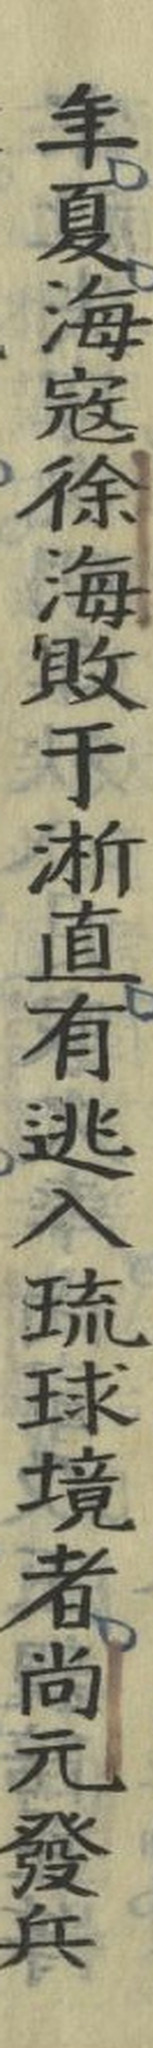年。夏。海寇徐海敗于浙直。有逃入琉球境者。尚元發兵
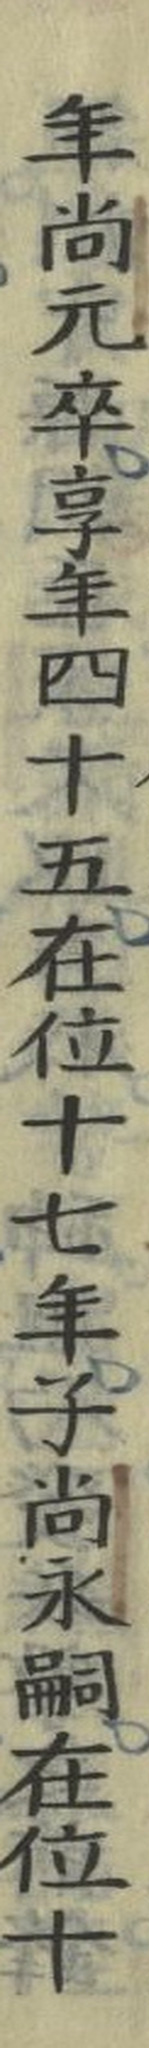年尚元卒。享年四十五。在位十七年。子尚永嗣。在位十
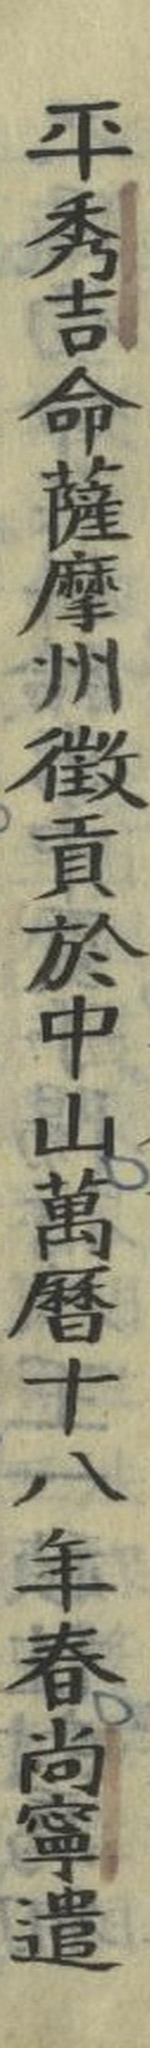平秀吉命薩摩州徵貢於中山。萬曆十八年春。尚寧遣
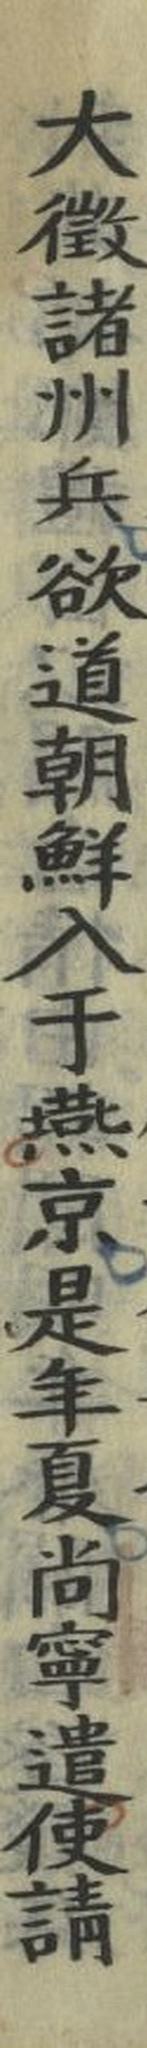大徵諸州兵。欲道朝鮮入于燕京。是年夏。尚寧遣

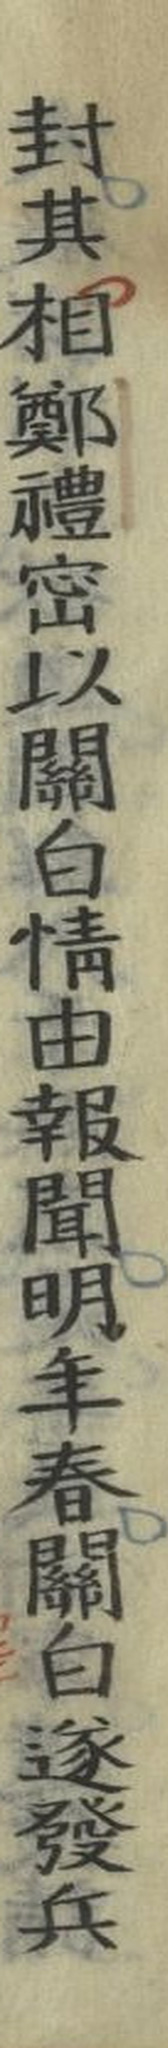封。其相鄭禮密以關白情由報聞。明年春。關白遂
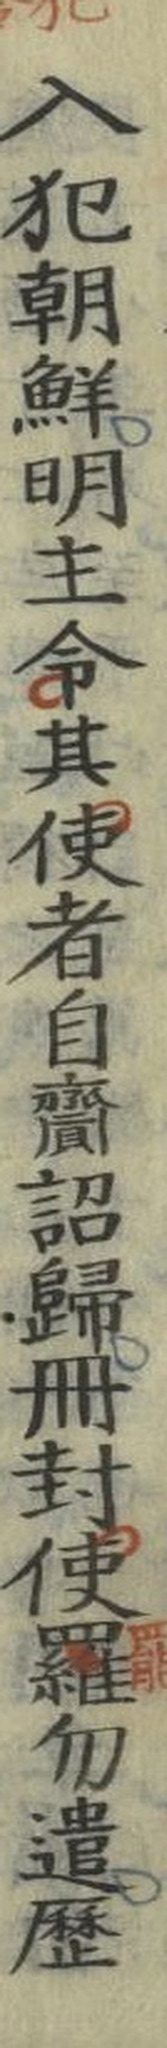入犯朝鮮。明主令其使者自齎詔歸。冊封使羅罷勿遣。歷
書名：南島志
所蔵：University of the Ryukyus Library
